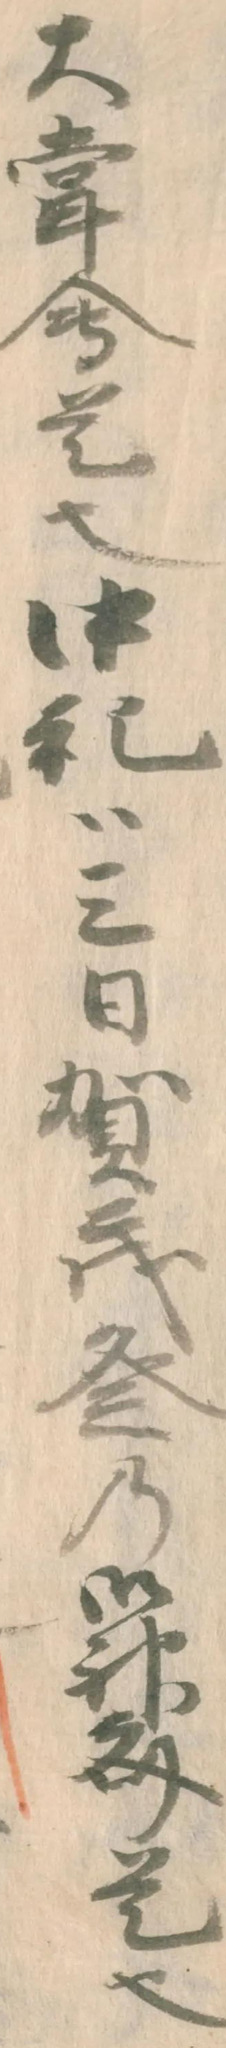大嘗会是也中祀は三日賀茂祭の御神斎是也
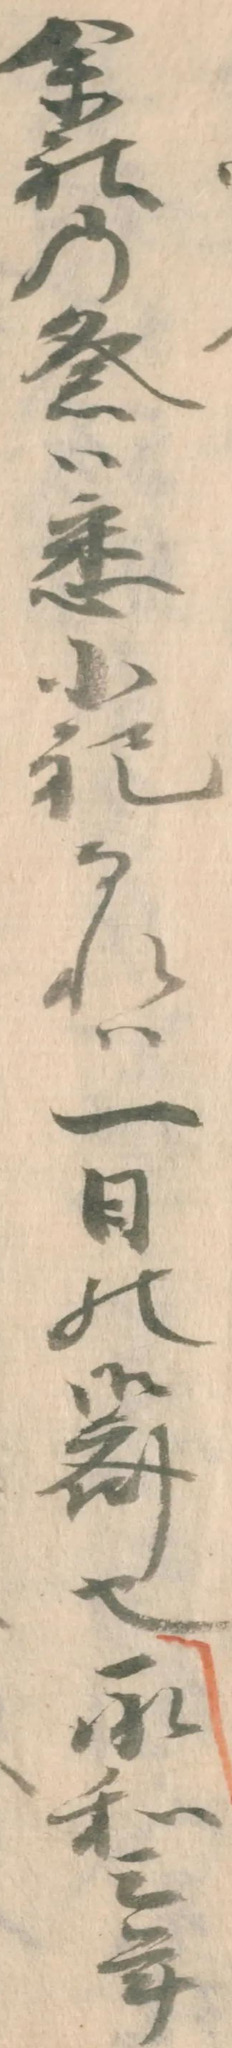余社の祭は悉小祀なれは一日の御斎也承和三年
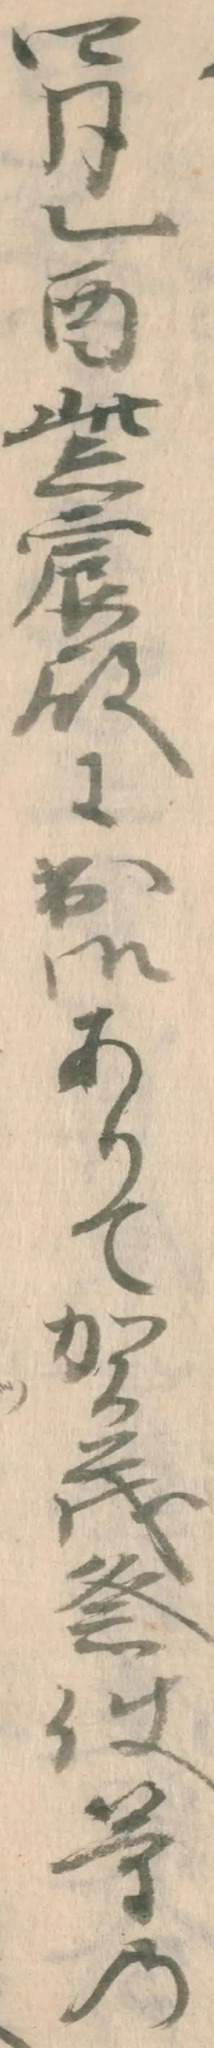四月乙酉紫宸殿に出御ありて賀茂祭使等の
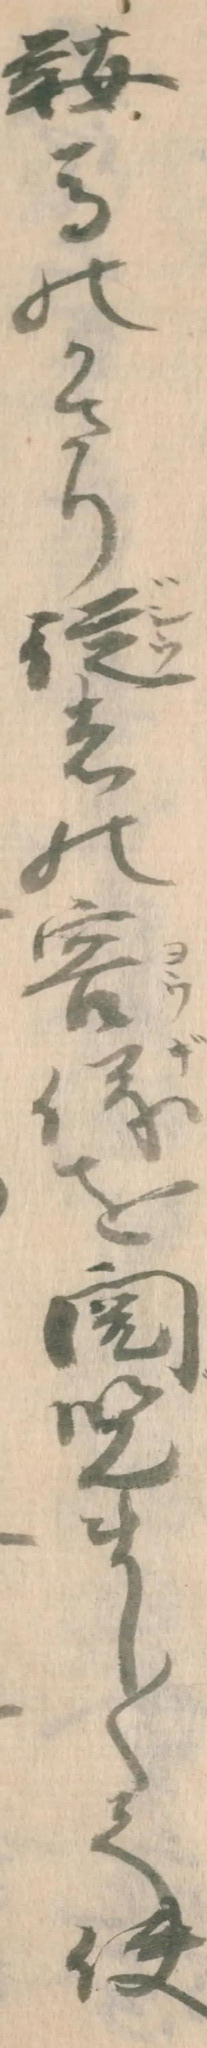鞍馬のかさり従-者の容儀を閲覧まし〳〵て使
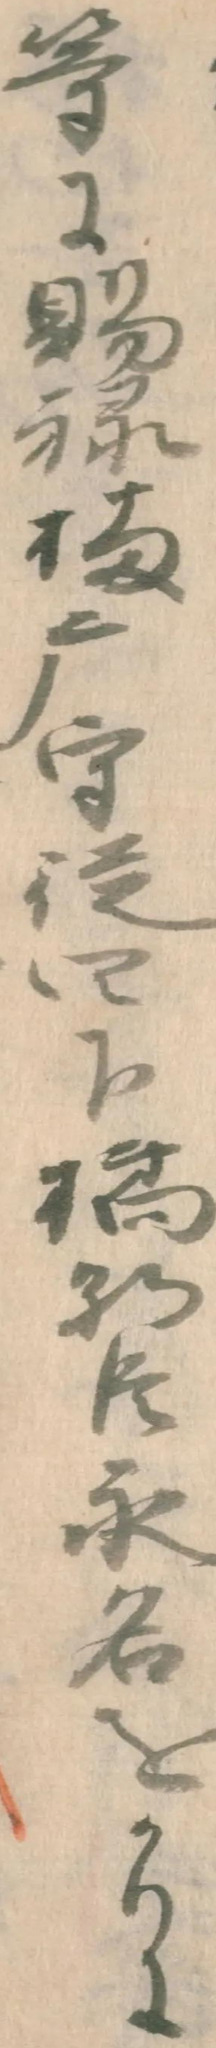等に賜禄播磨守従四下橘朝臣永名をかりに
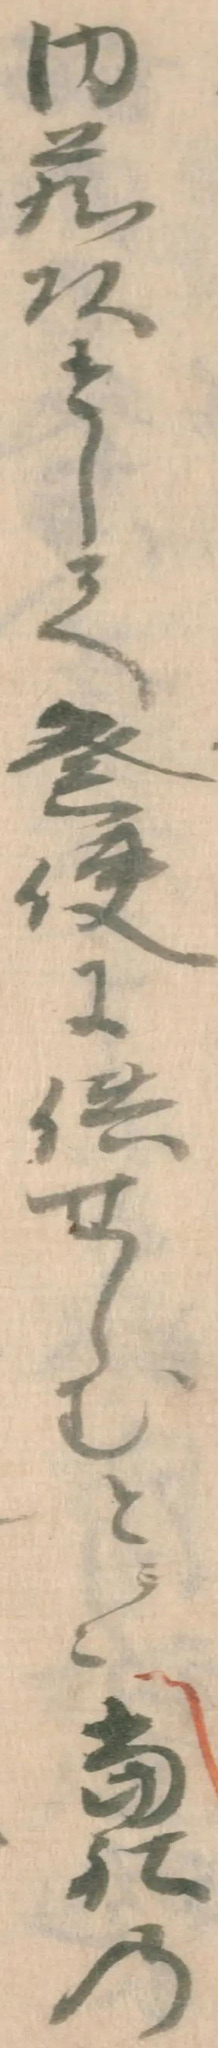内蔵頭として祭使に供せしむと云々当社の
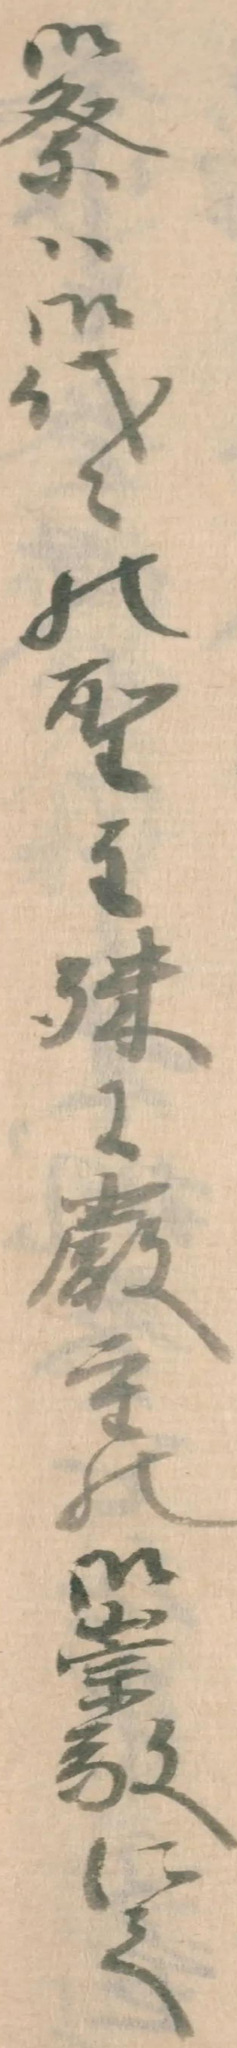御祭は御代々の聖主殊に厳重の御崇敬にて
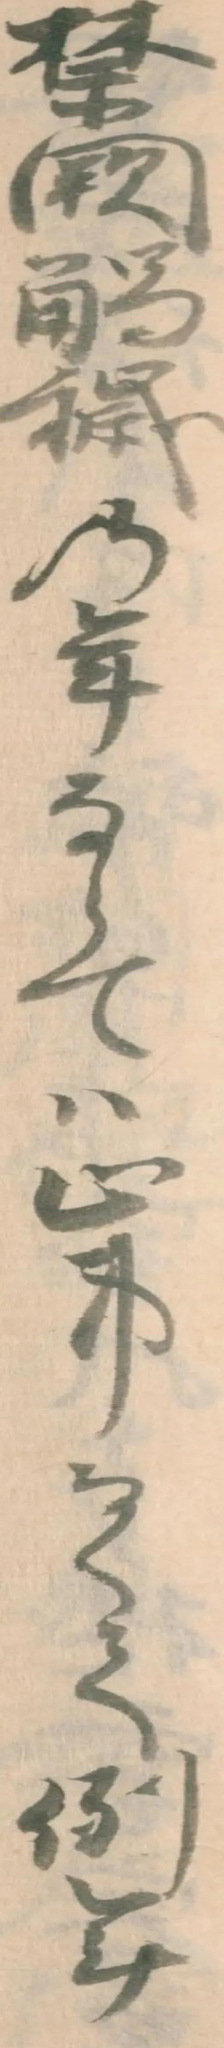禁闕觸穢の年ならては止事なくて例年
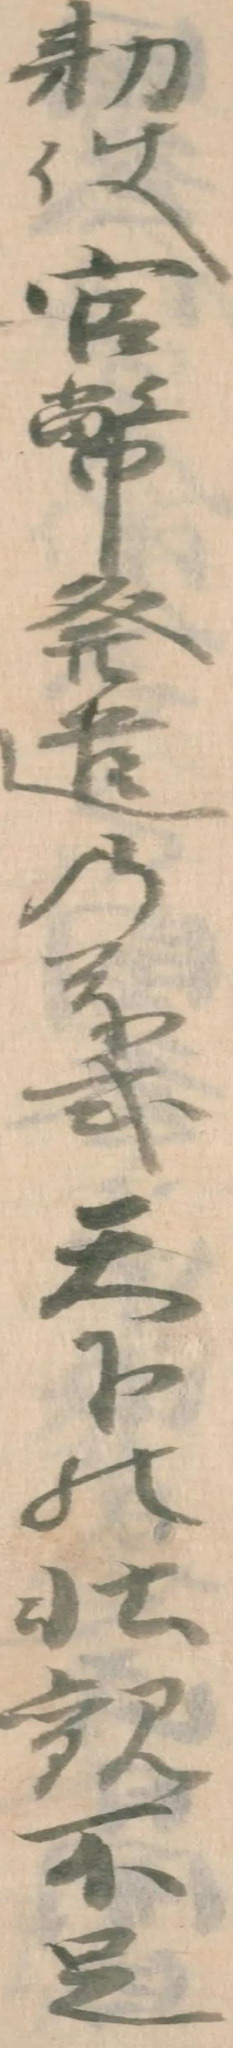勅使官幣発遣の義式天下の壮観不足
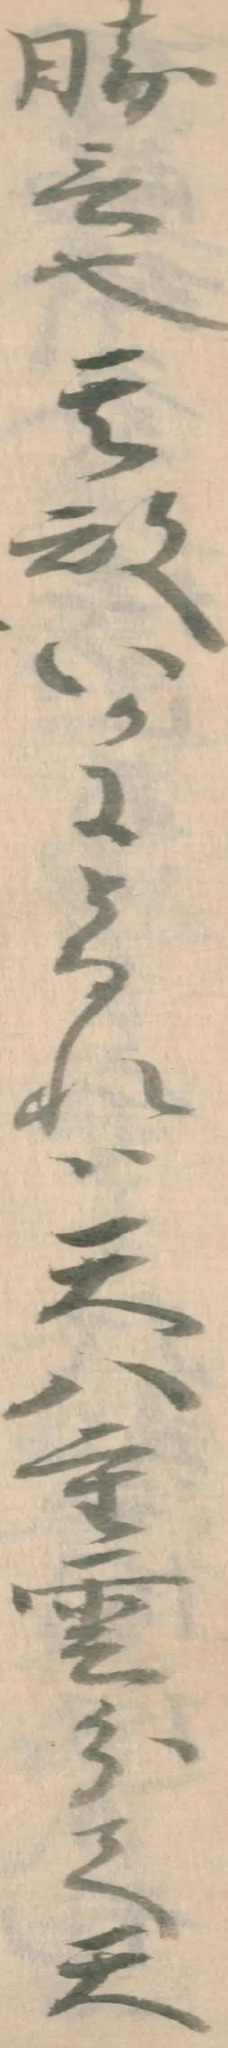勝言也其故いかにとなれは天八重雲分て天
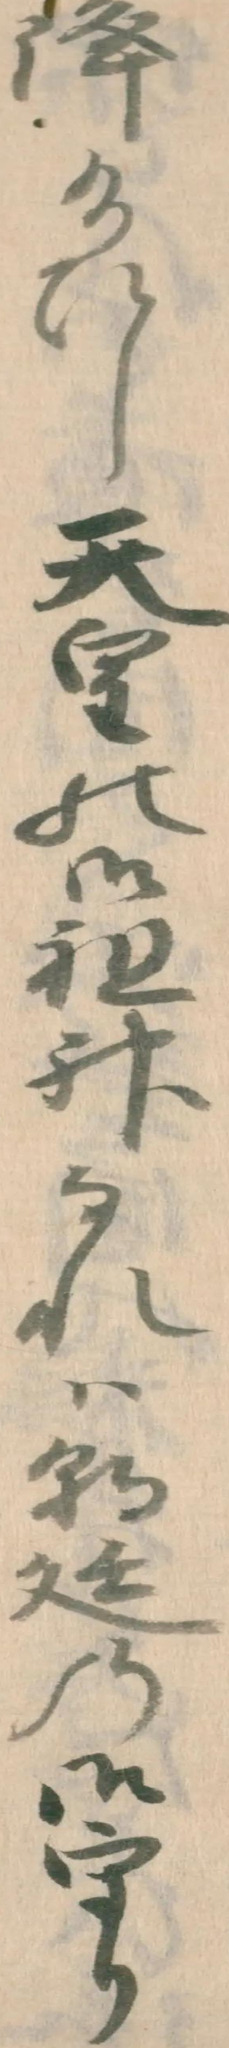降給ひし天皇の御祖神なれは朝廷の御守り
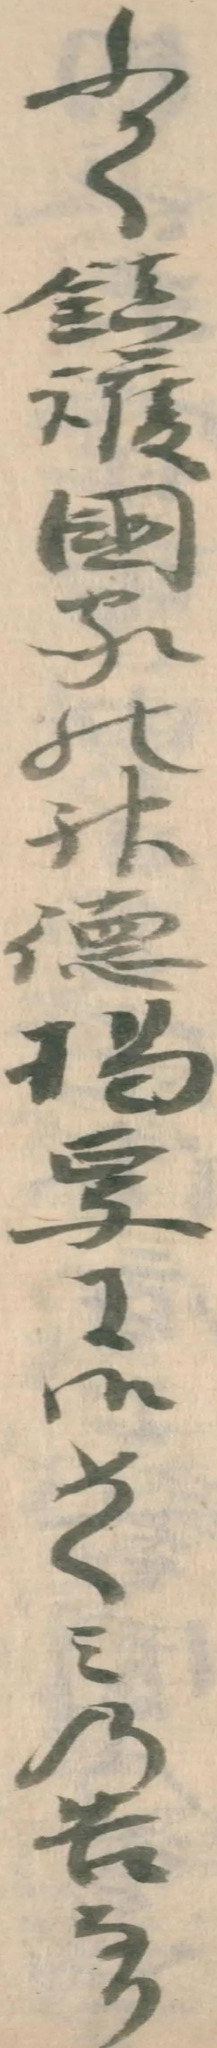ふかく鎮護国家の神徳掲焉に御めくみの告なり
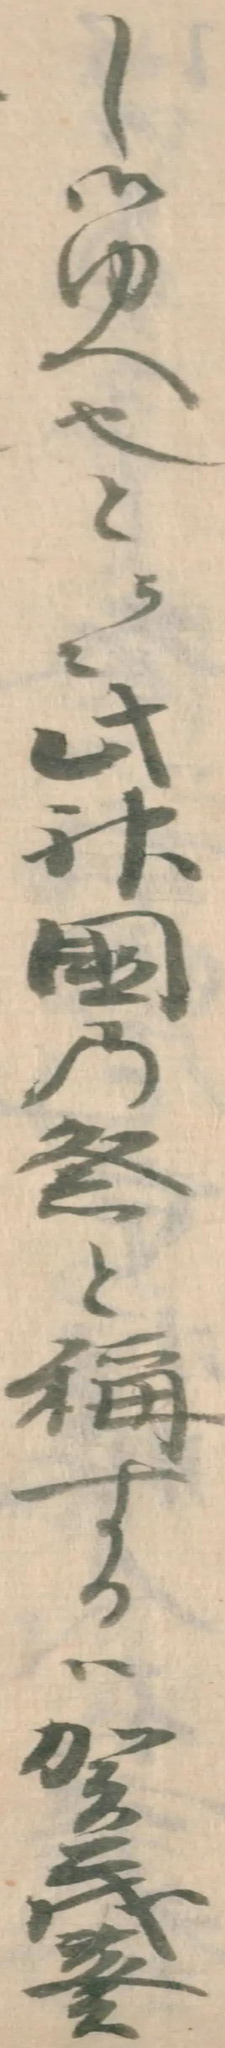し御ゆへ也と云々此神国の祭と称するは賀茂葵
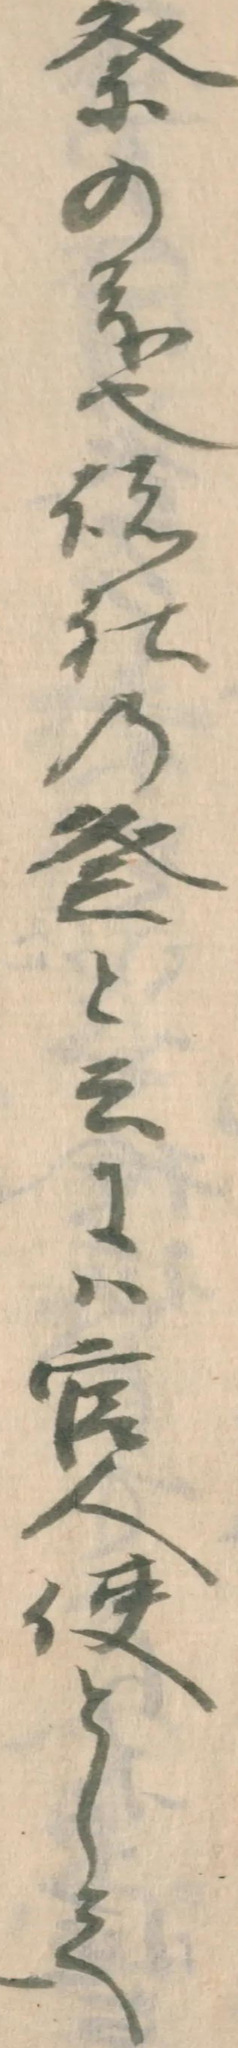祭の義也諸社の祭と云には官人使として
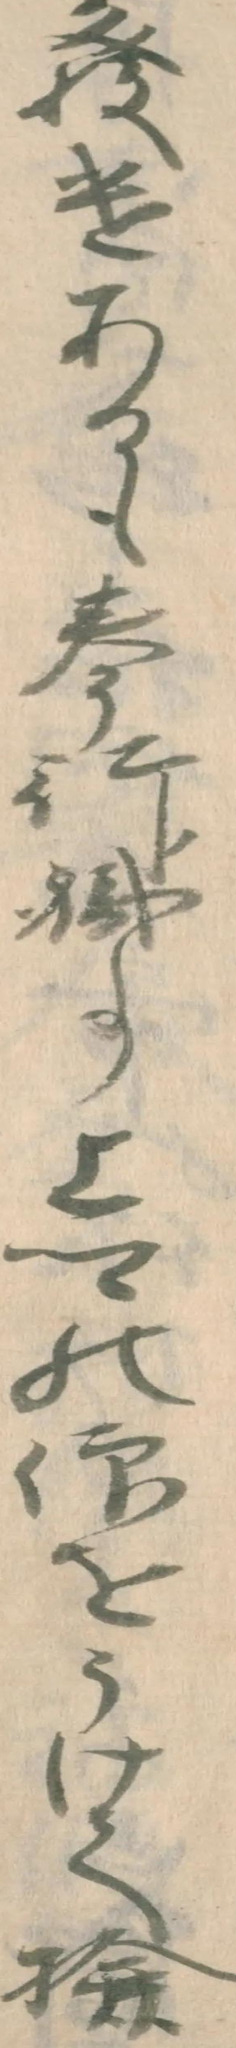発遣あるも奉行職事上卿の仰をうけて検
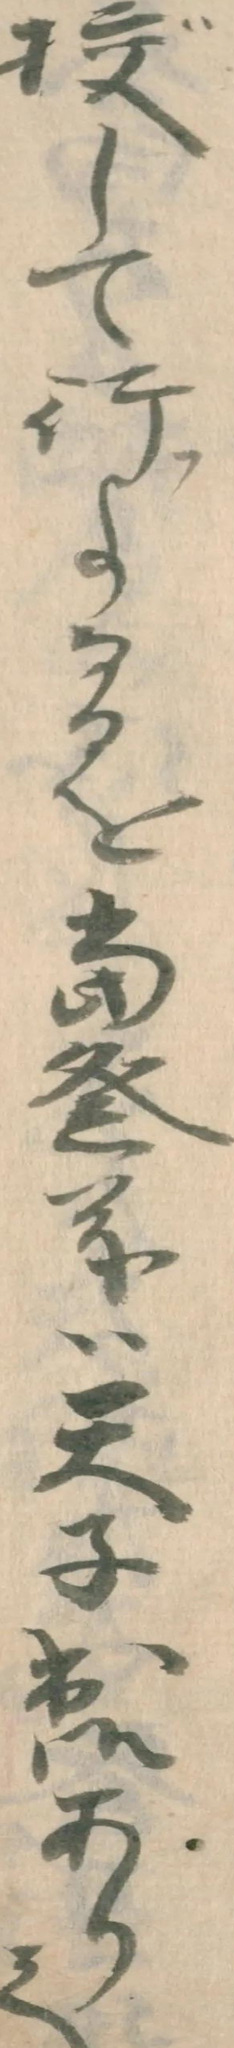校して行事なるを当祭義は天子出御ありて
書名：賀茂社記録. 第1冊
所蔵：国立国会図書館 National Diet Library, JAPAN
